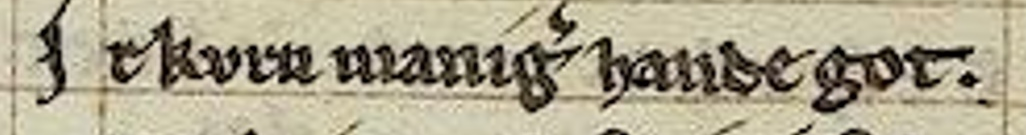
Irkvrn manig(er) hande got.
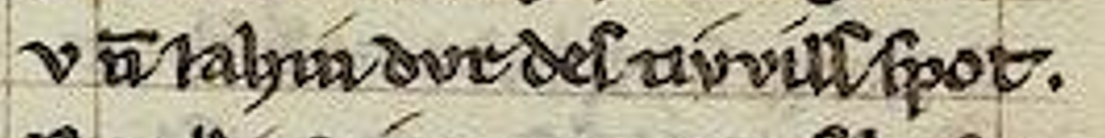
Vn(d) iahin dvr deſ tivvilſ ſpot.
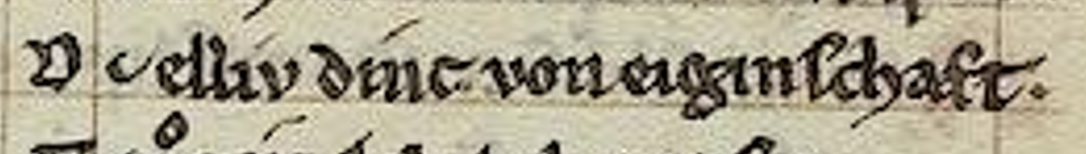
D(az) elliv dinc von eiginſchaft.
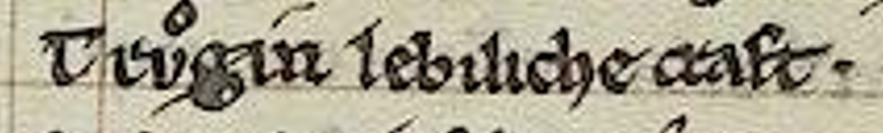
Trv°ogin lebiliche craft.
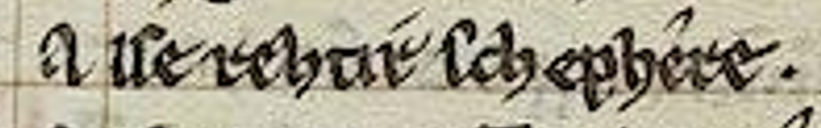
Alſe rehtir ſchephere.
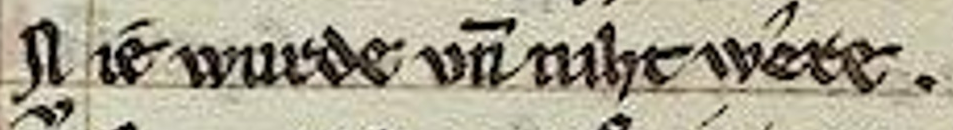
Nie wurde vn(d) nicht were.
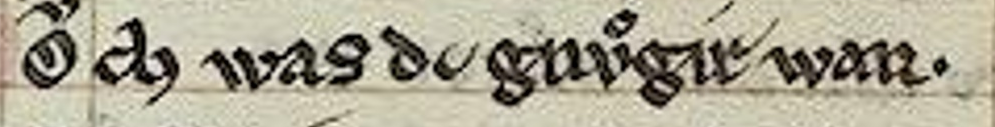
O°vch was d(az) gnv°ogir wan.
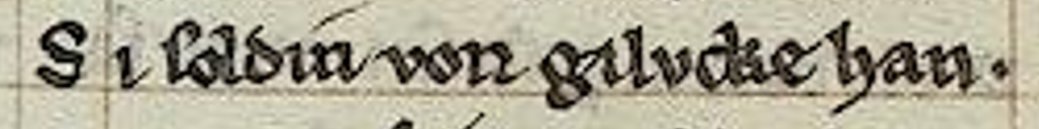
Si ſoldin von gilvcke han.
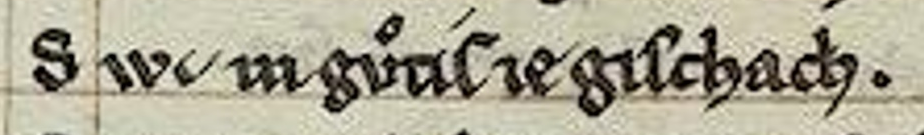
Sw(az) in gv°otiſ ie giſchach.
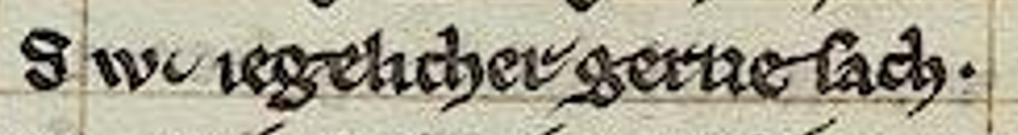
Sw(az) iegelicher gerne ſach.
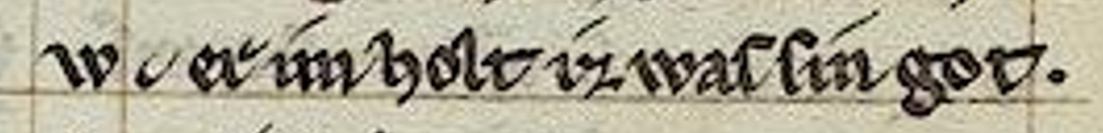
W(az) er im holt iz waſ ſin got.
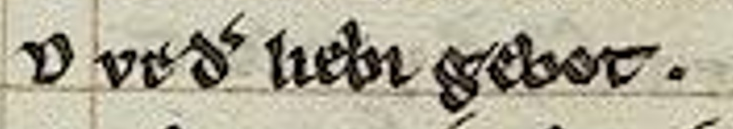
Dvr d(er) liebi gebot.
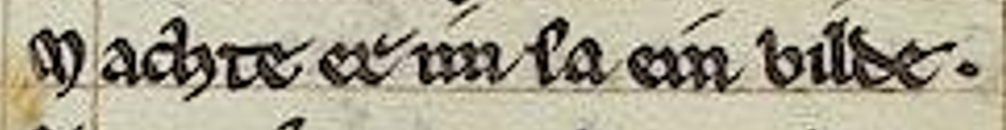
Machte er im ſah ein bilde.
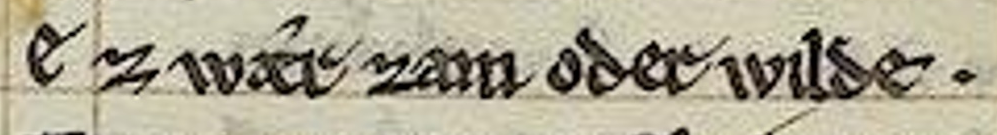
Ez w[ae]r zam oder wilde.
